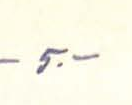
5.
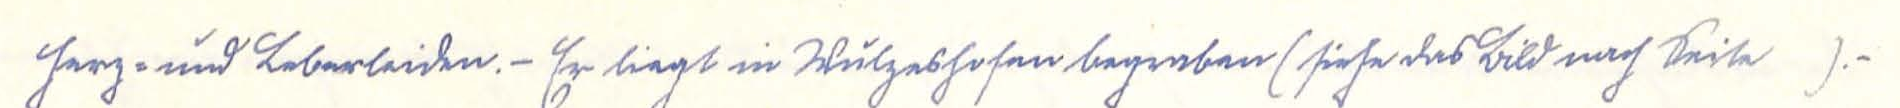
Herz- und Leberleiden.- Er liegt in Wulzeshofen begraben (siehe das Bild nach Seite).
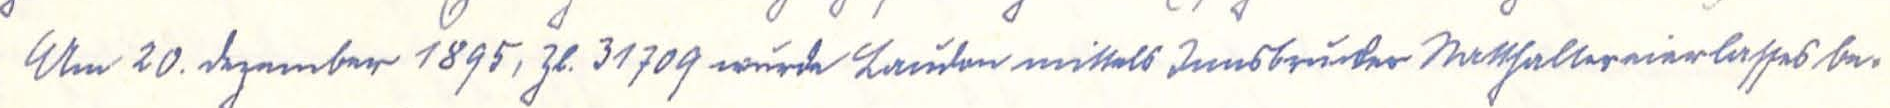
Am 20. Dezember 1895, zl. 31609 wurde Laudon mittels Innsbrucker Statthaltereierlasses be-
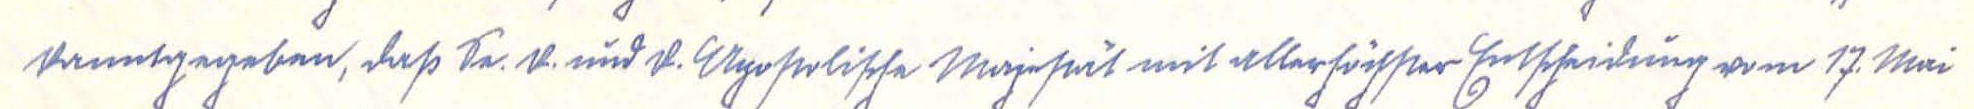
kanntgegeben, daß Sn. k. und k. Apostolische Majestät mit allerhöchster Entscheidung vom 17. Mai
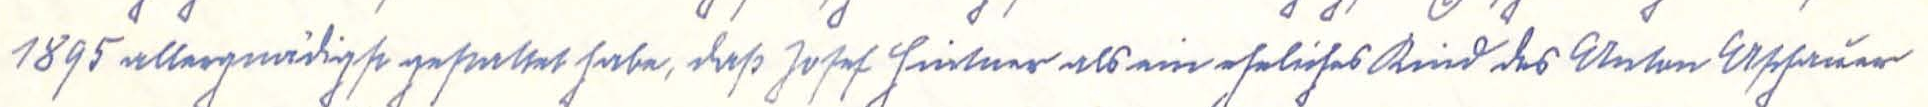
1895 allergnädigst gestattet habe, daß Josef Hintner als ein eheliches Kind des Anton Aschauer
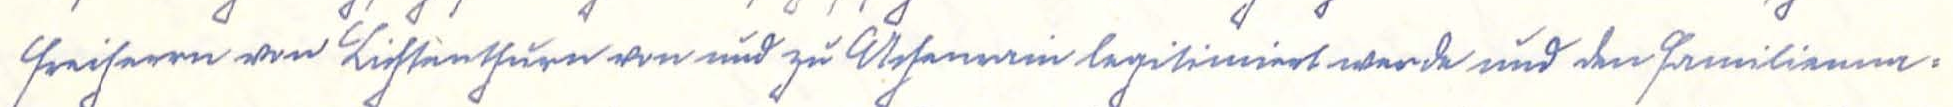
Freiherrn von Lichtenthurn vin und zu Achenrain legitimiert werde und den Familiena-
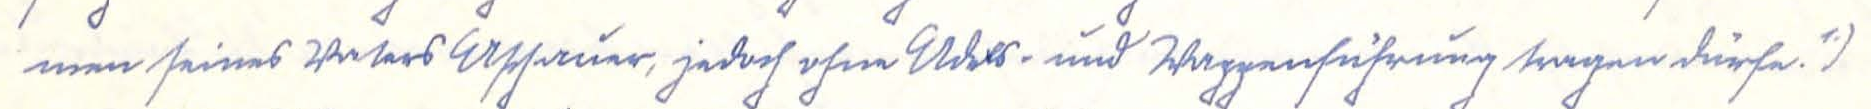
men seines Vaters Aschauer, jedoch ohne Adels- Wappenführung und tragen dürfe 1.)
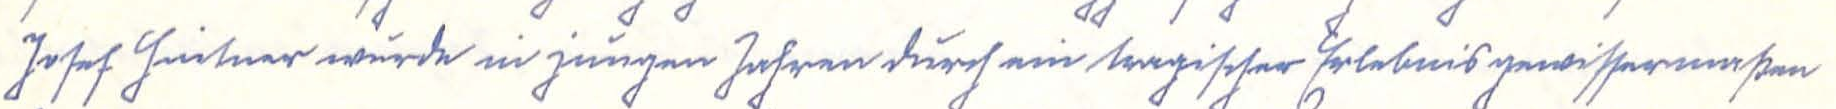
Josef Hintner wurde in jungen Jahren durch ein tragischer Erlebnis gewissermaßen
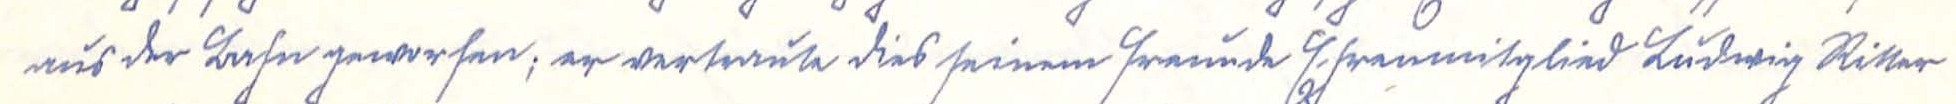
aus der Bahn geworfen; er vertraute dies seinem Freunde Ehrenmitglied Ludwig Ritter
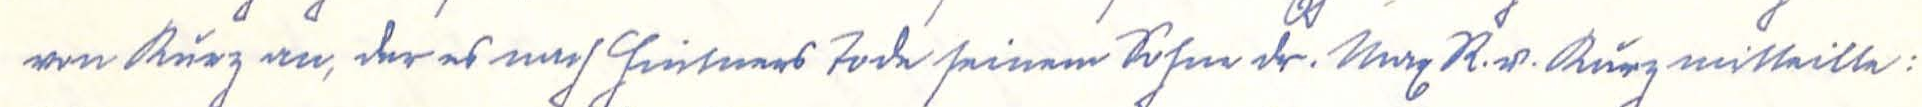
von Kurz an, der es nach Hintners Tode seinem Sohn Dr. Max R. v. Kurz mitteilte:
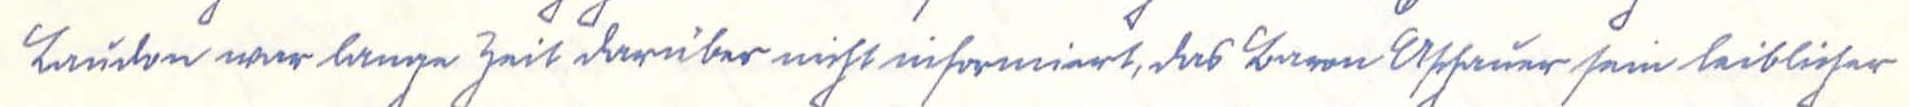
Laudon war lange Zeit darüber nicht informiert, das Baron Aschauer sein leiblicher
